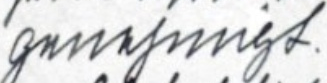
genehmigt.
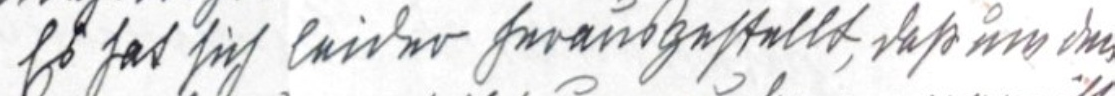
Es hat sich leider herausgestellt, daß um den
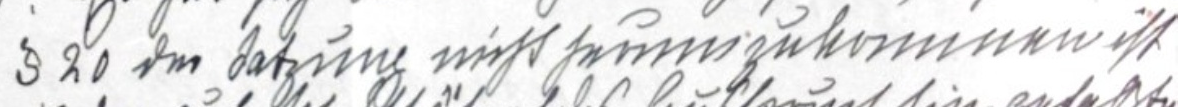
§20 der Satzung nicht herumzukommen ist.
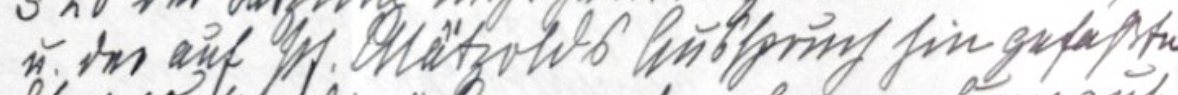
u, der auf Pf. Mätzolds Ausspruch hin gefaßten
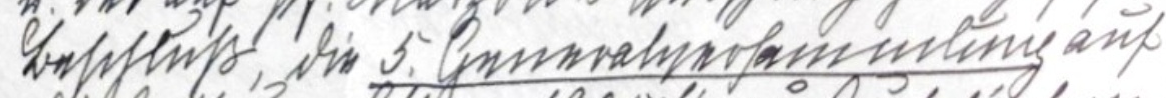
Entschluß, die 5. Generalversammlung auf
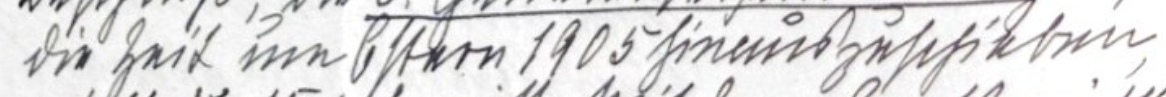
die Zeit nach Ostern 1905 hinauszuschueben
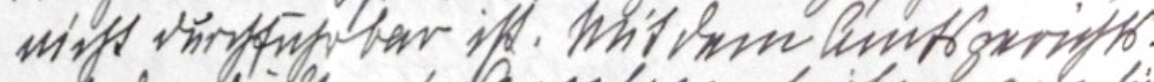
nicht durchführbar ist. Mit der Amtsgerichts
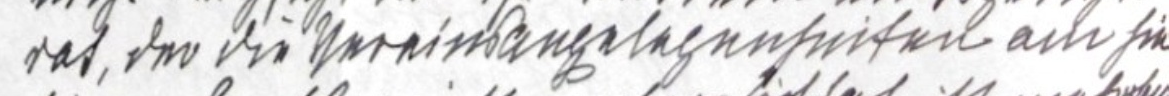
rat, der die Vereinsangelegenheiten am hie
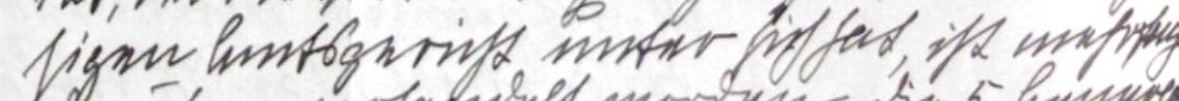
sigen Amtsgericht unter sich hat ist mehrfach
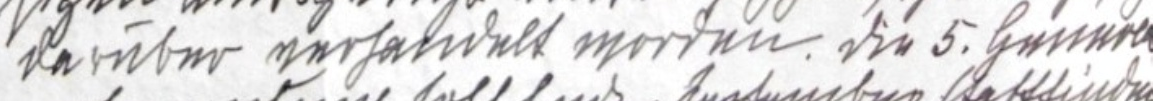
darüber verhandelt worden. Die 5. General
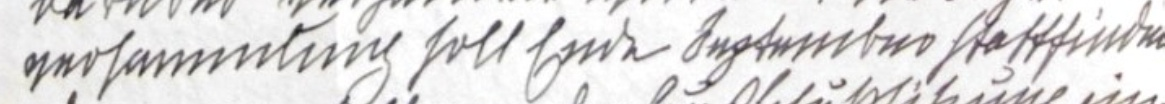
versammlung soll Ende September stattfinden
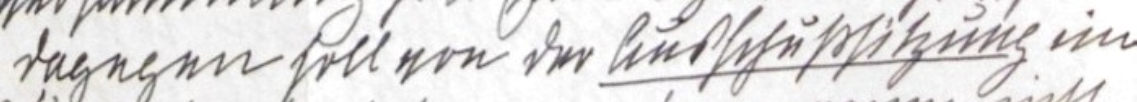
Dagegen soll von der Ausschunßsitzung im
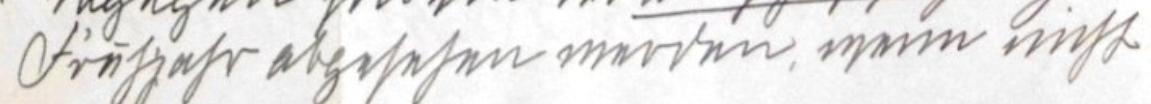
Frühjahr abgesehen werden, wenn nicht
